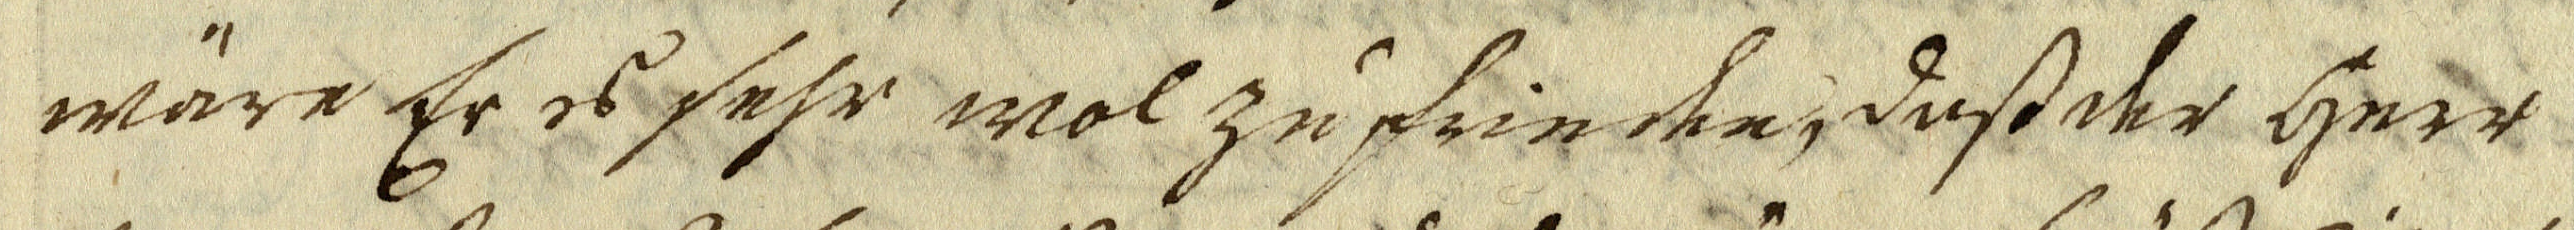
wäre Er es sehr wol zufrieden, daß der Herr
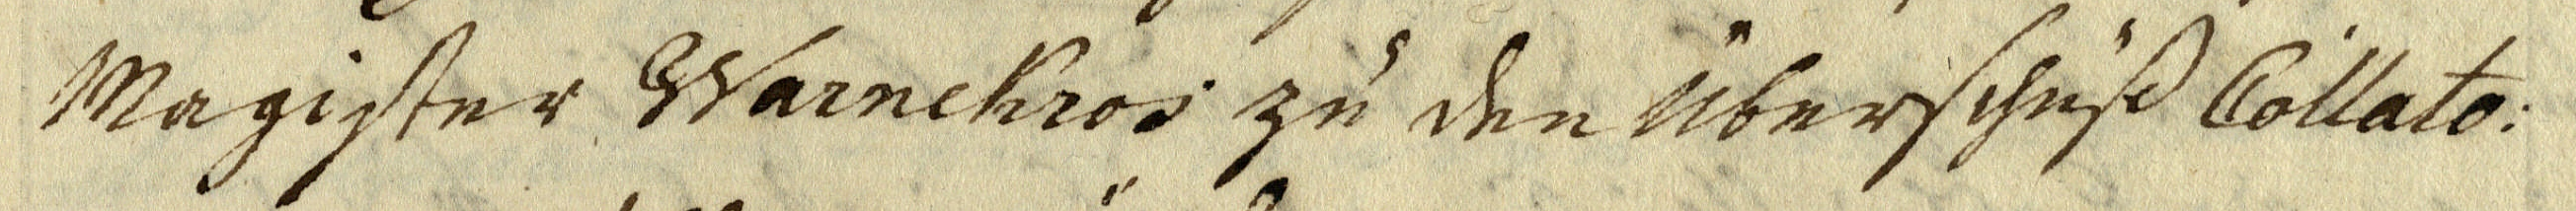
Magister Warnekros zu den Überschuß Collato¬
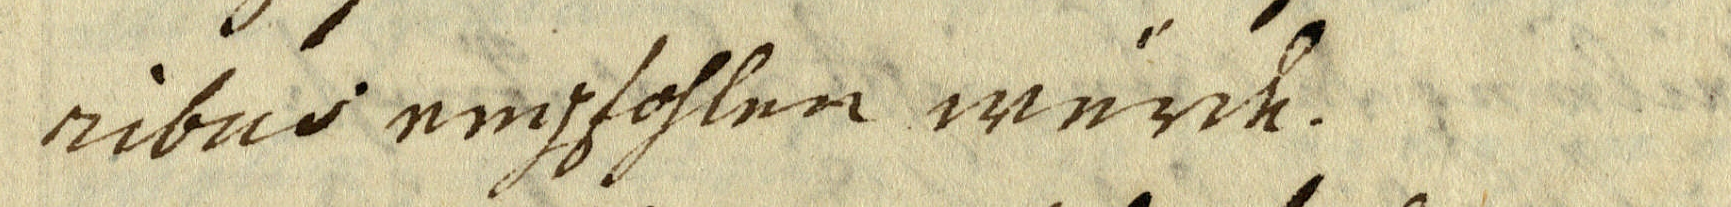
ribus empfohlen würde.
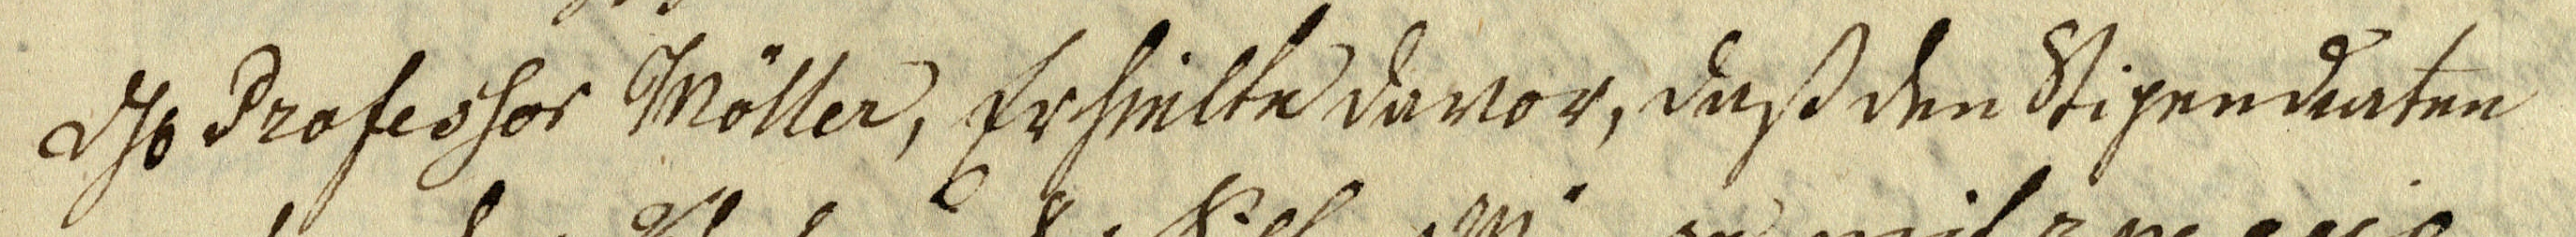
dh Professor Möller, Er hielte davor, daß den Stipendiaten
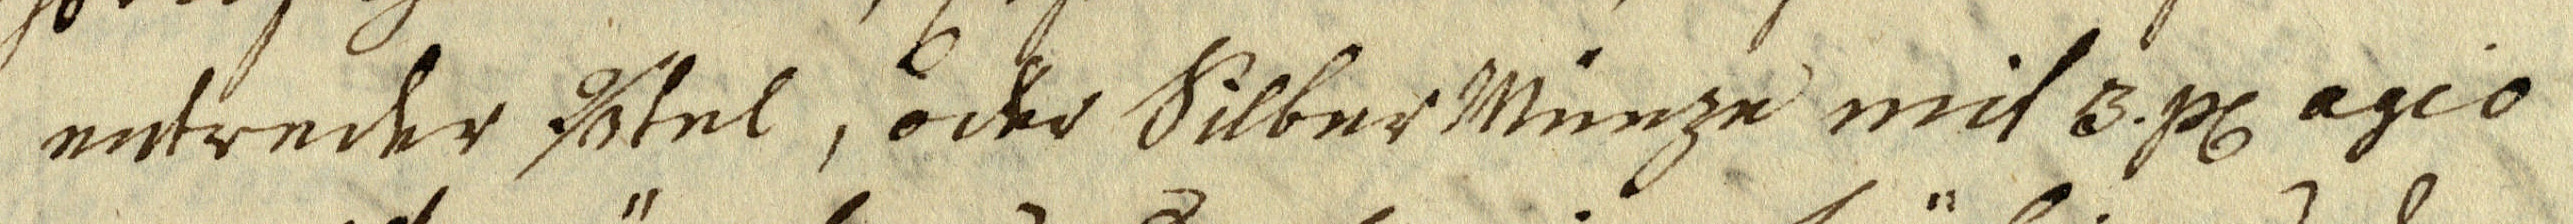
entweder ²/³ tel, oder Silber Münze mit 3 p. agio
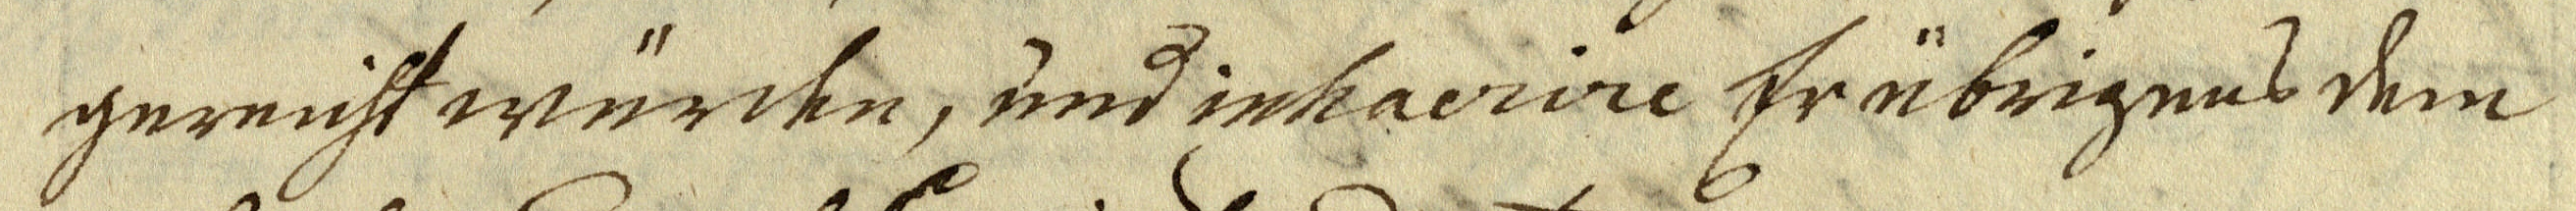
gereicht würden, und inhaerire Er übrigens dem
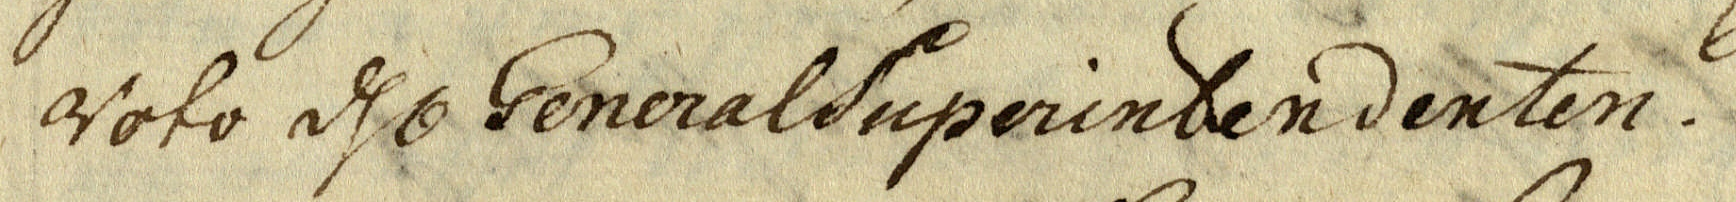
voto dh GeneralSuperintendenten.
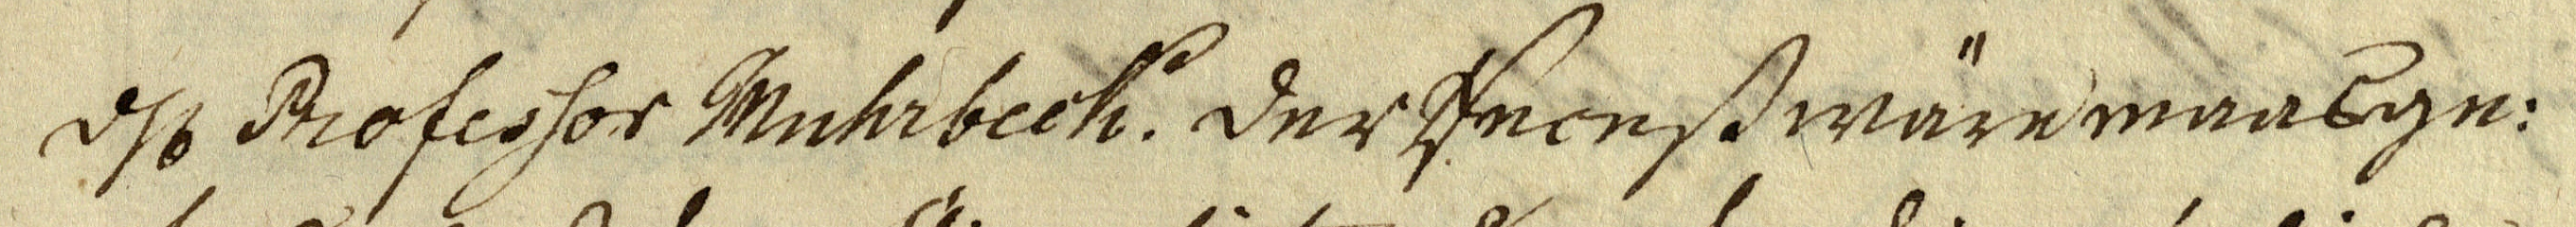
dh Professor Muhrbeck. der Receß wäre maasge¬
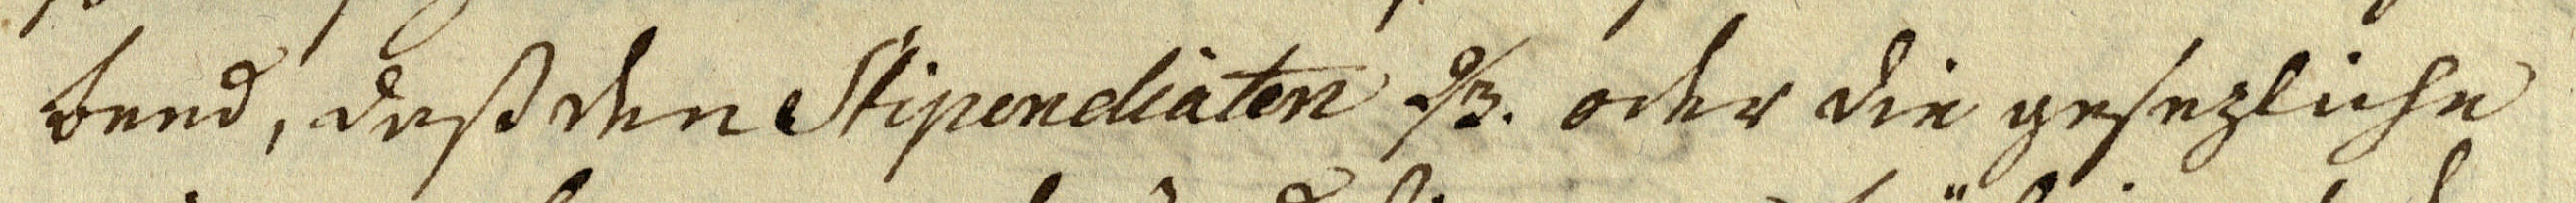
bend, daß den Stipendiaten ²/³. oder die gesezliche
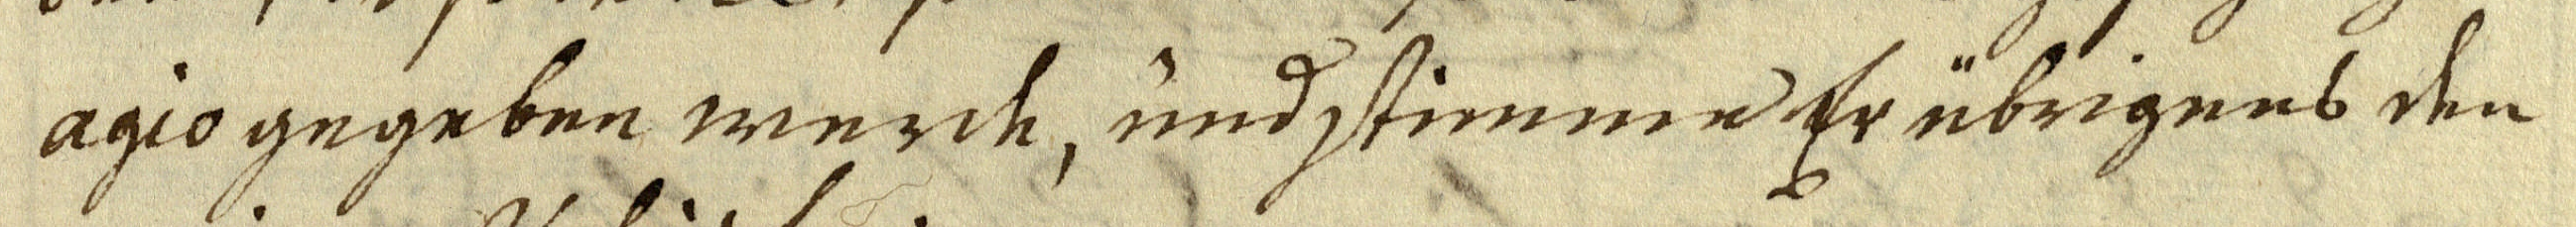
agio gegeben werde, und stimme Er übrigens den
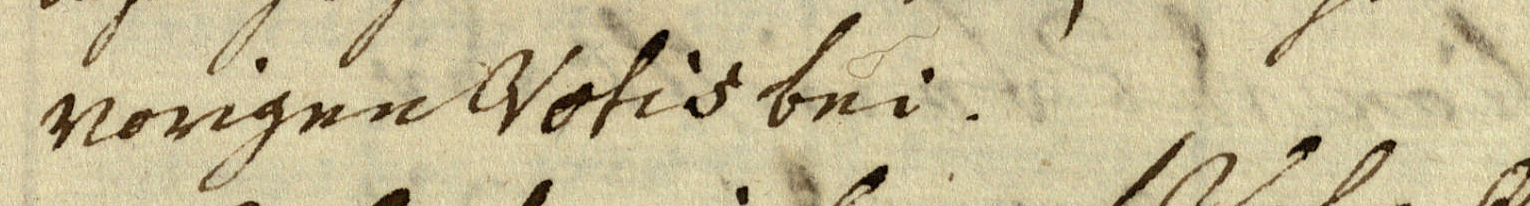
vorigen Votis bei.
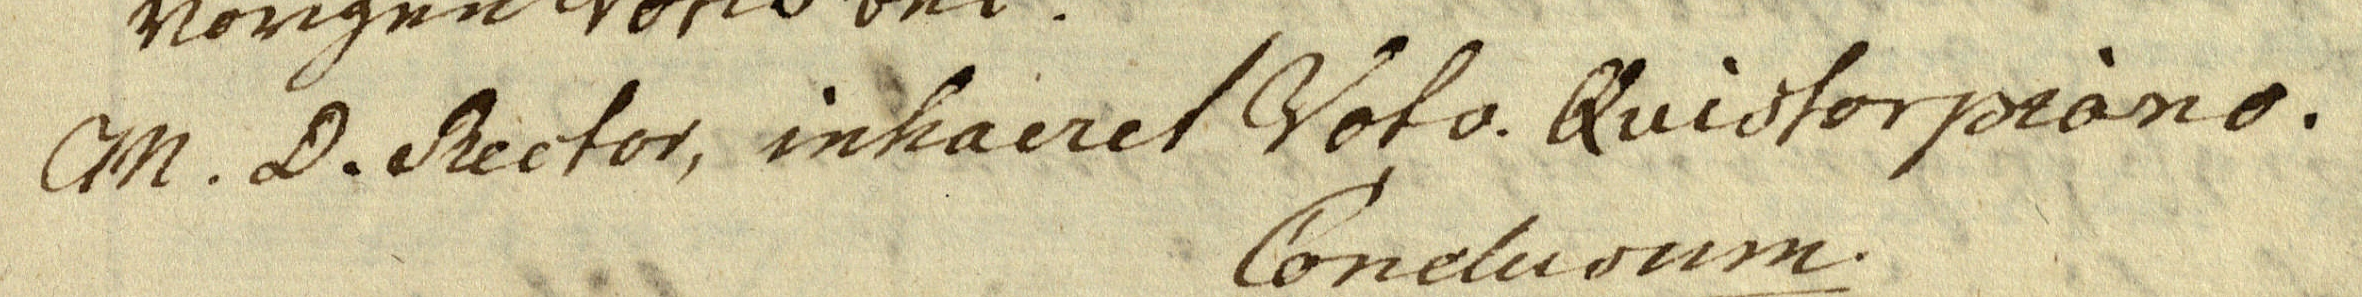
M. D. Rector, inhaeret Voto Quistorpiano.
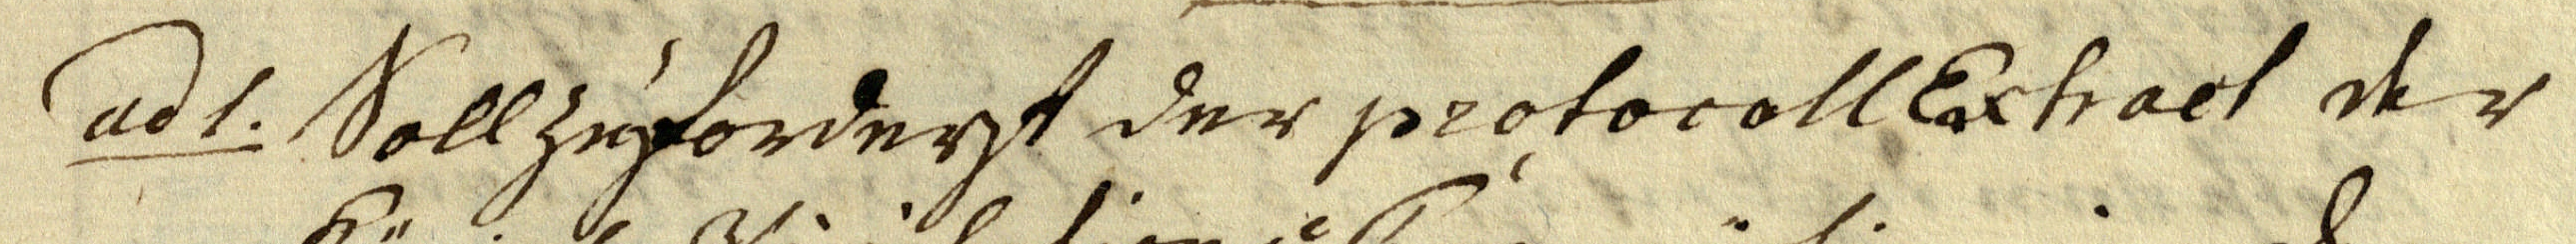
ad 1. Soll zuvorderst der protocoll Extract der
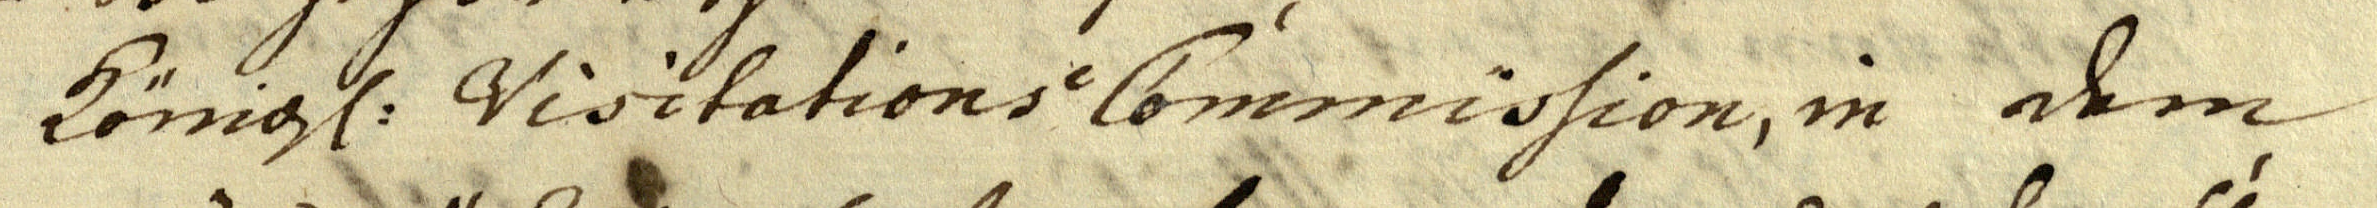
Königl. Visitations Commission, in dem
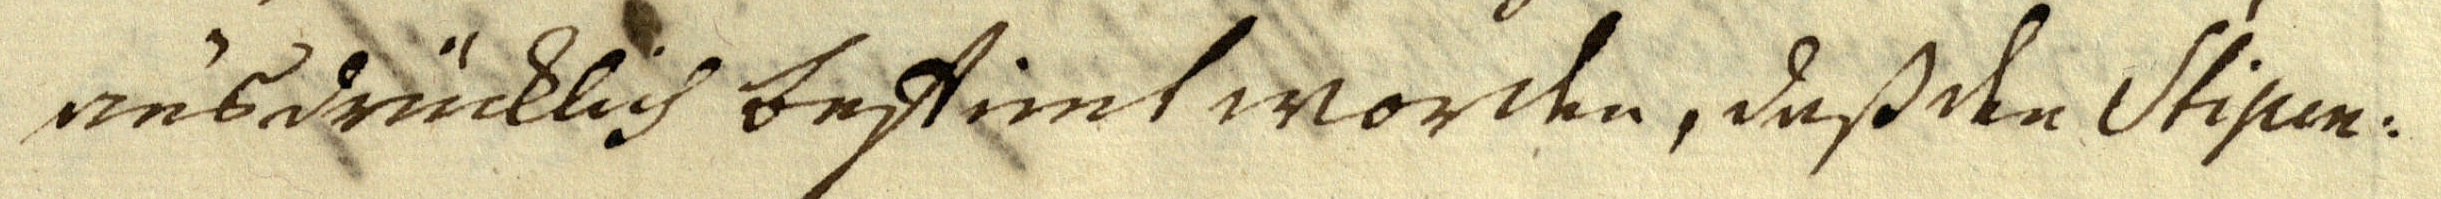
ausdrücklich bestimt worden, daß den Stipen¬
